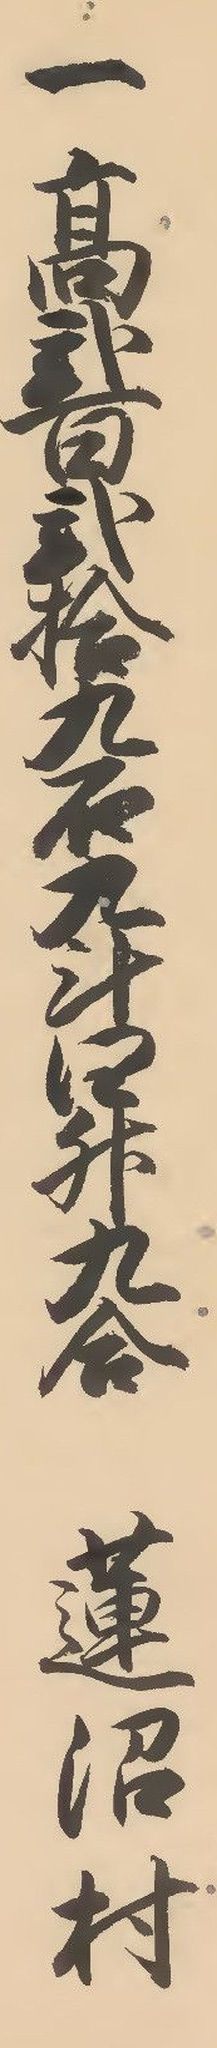一高弐百弐拾九石九斗四升九合蓮沼村
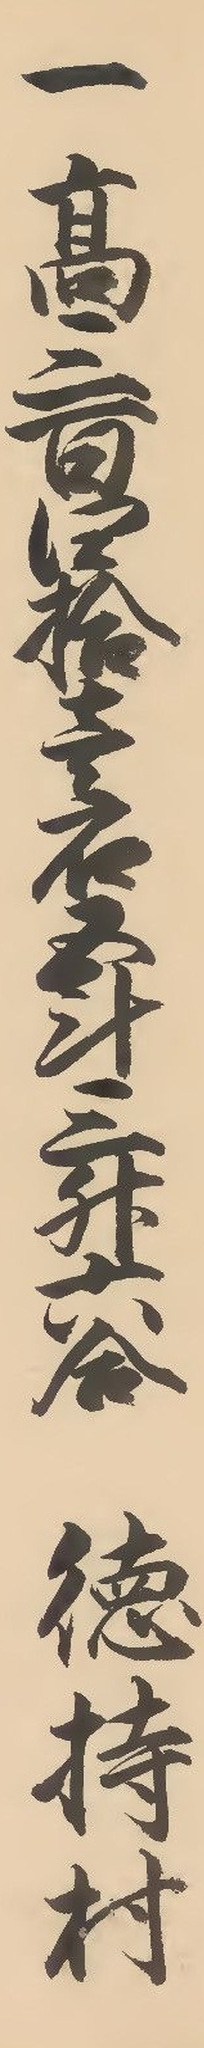一高三百四拾壱石五斗三升六合徳持村
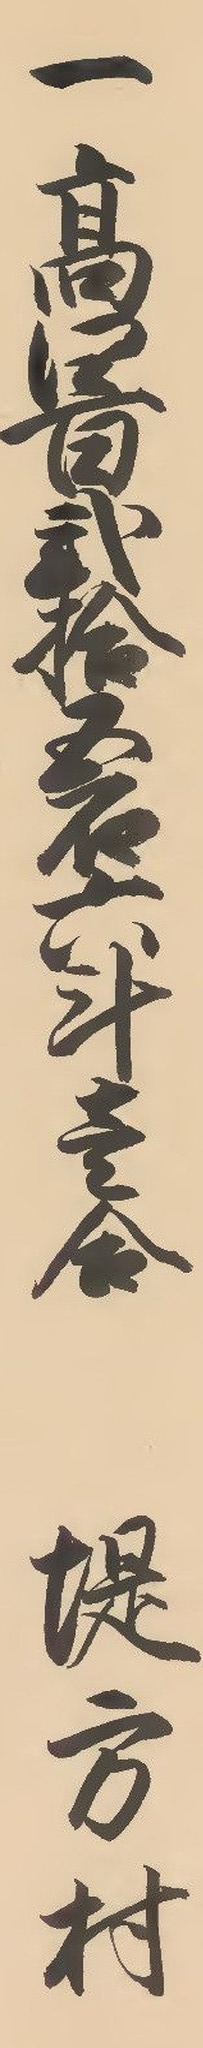一高四百弐拾五石六斗壱合堤方村
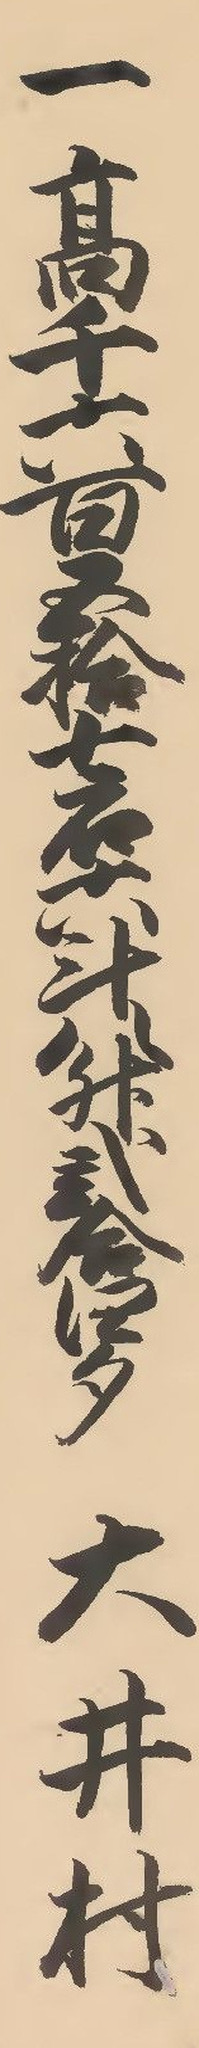一高千六百五拾七石六斗八升弐合四勺大井村
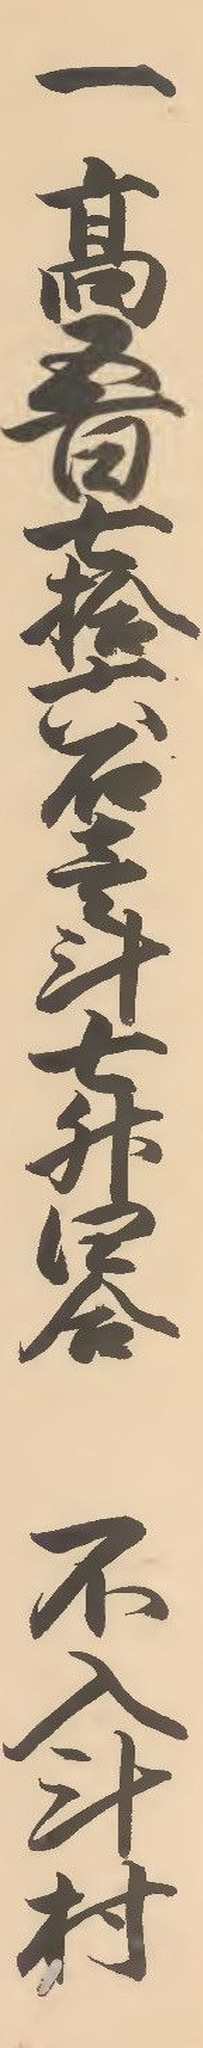一高五百七拾六石壱斗七升四合不入斗村
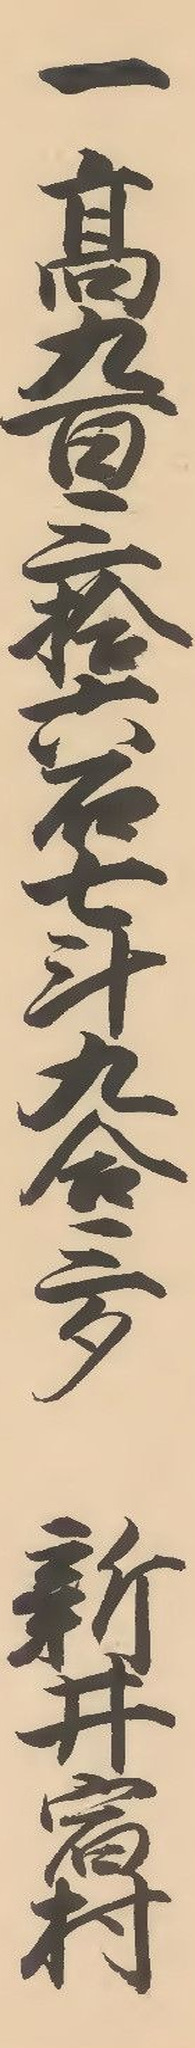一高九百三拾六石七斗九合三勺新井宿村
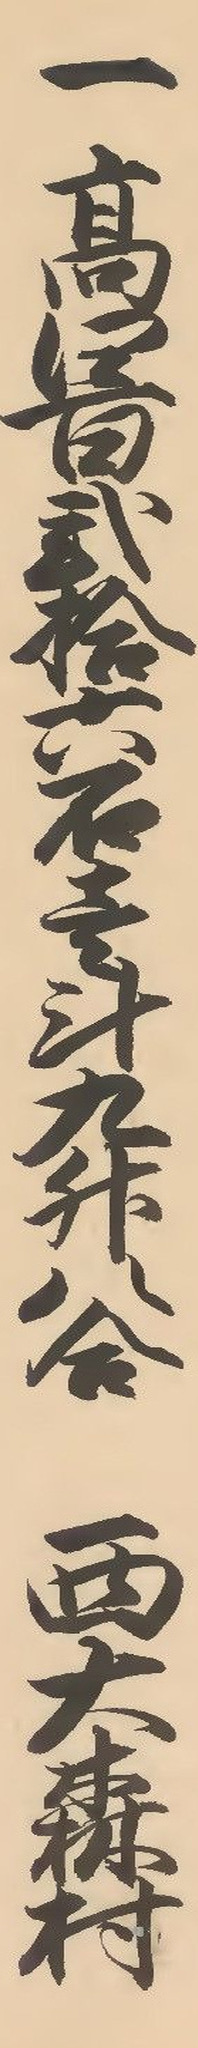一高四百弐拾六石壱斗九升八合西大森村
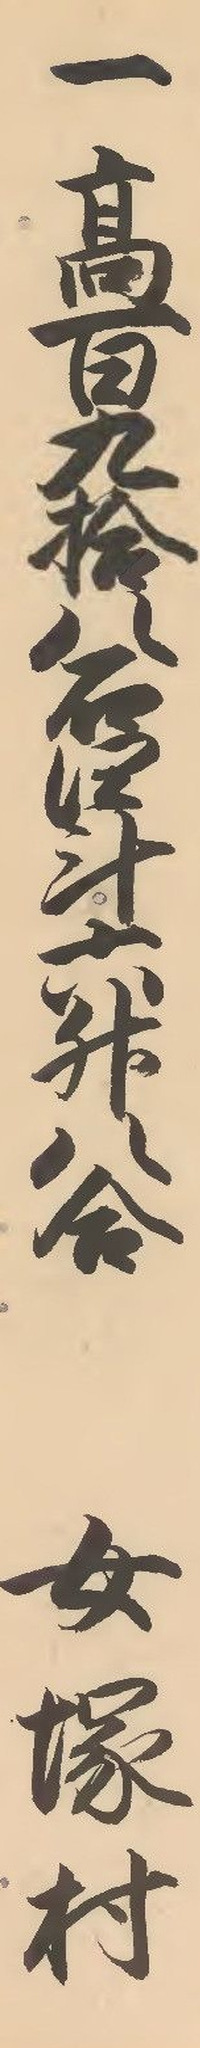一高百九拾八石四斗六升八合女塚村

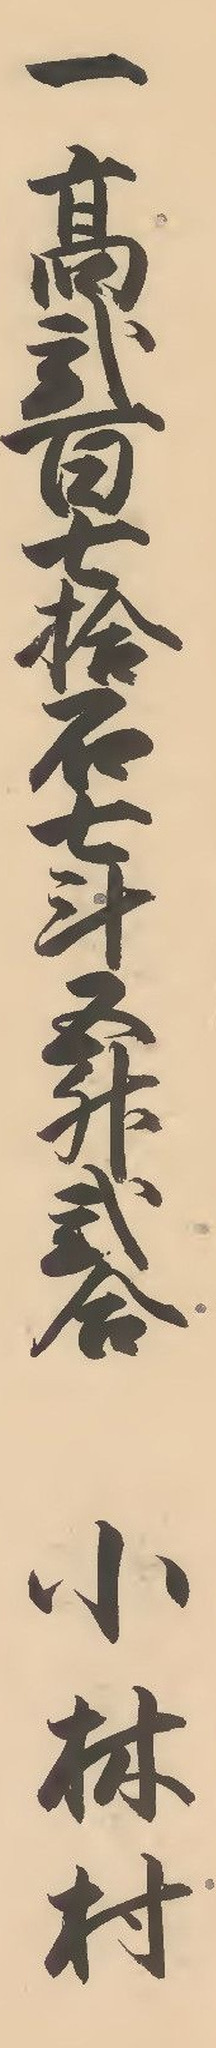一高弐百七拾石七斗五升弐合小林村
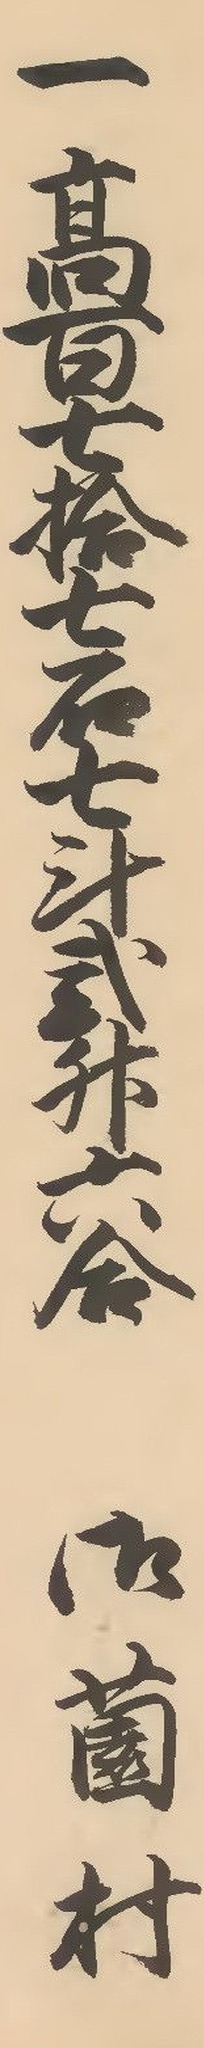一高百七拾七石七斗弐升六合御園村
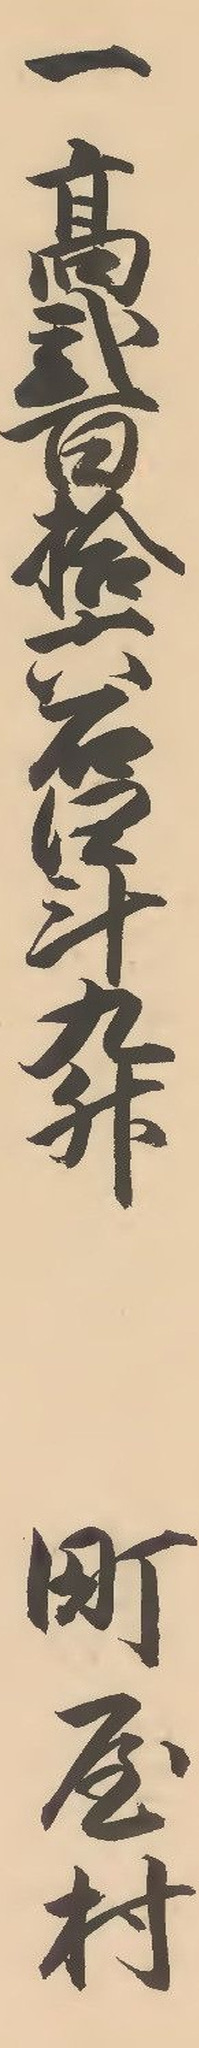一高弐百拾六石四斗九升町屋村
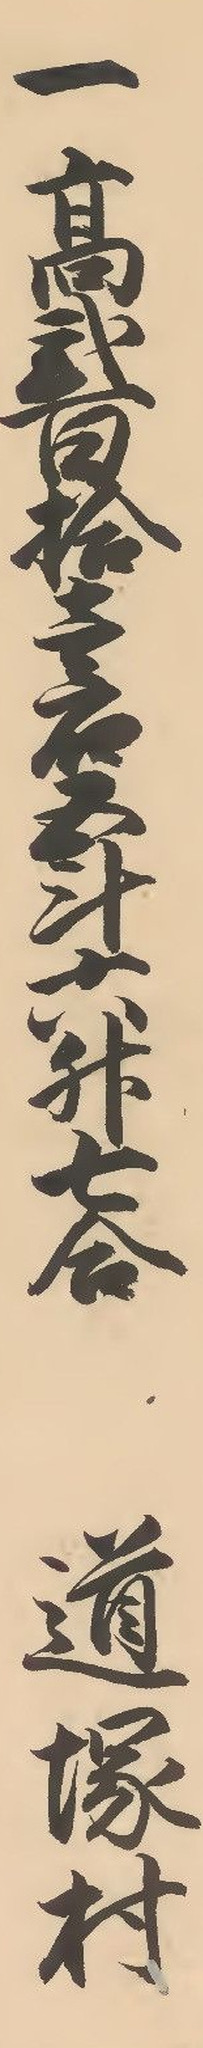一高弐百拾壱石五斗六升七合道塚村
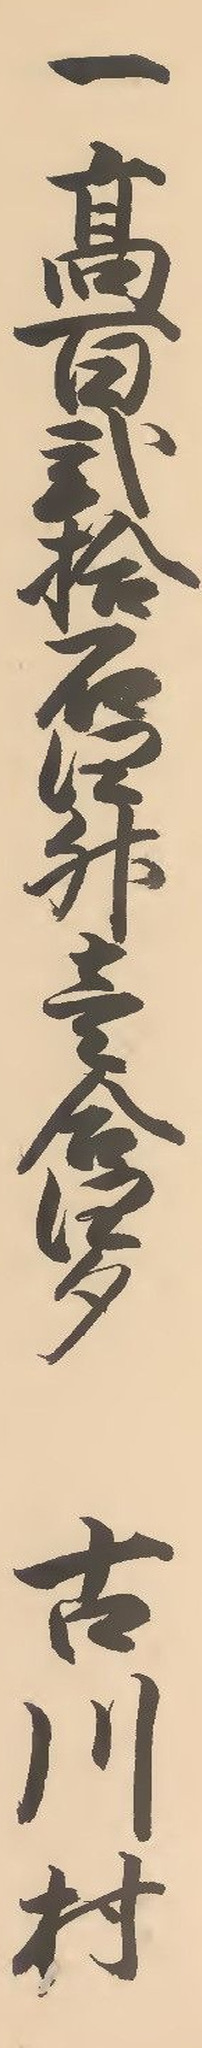一高百弐拾石四升壱合四勺古川村
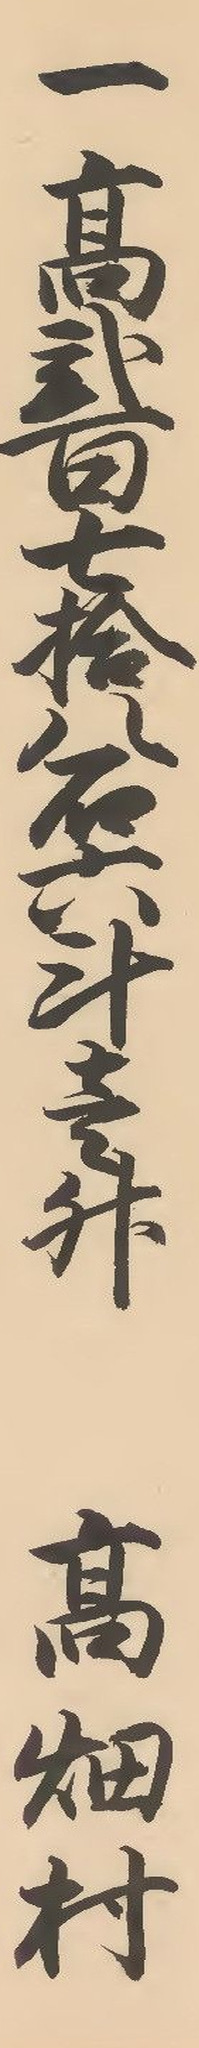一高弐百七拾八石六斗壱升高畑村
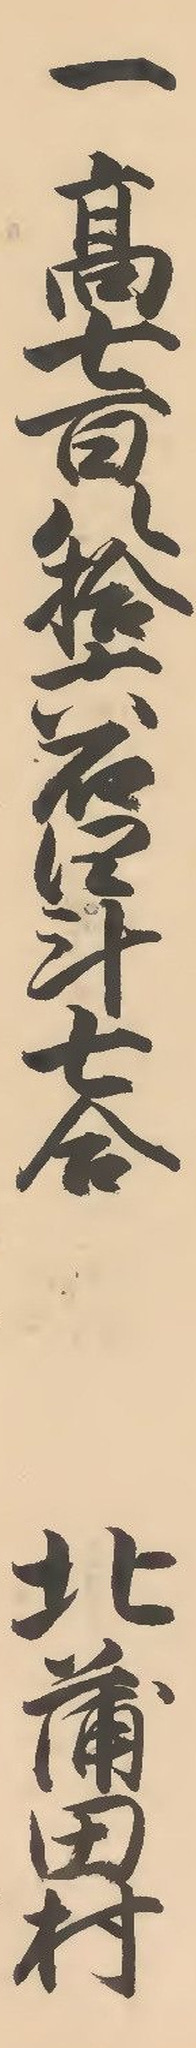一高七百八拾六石四斗七合北蒲田村

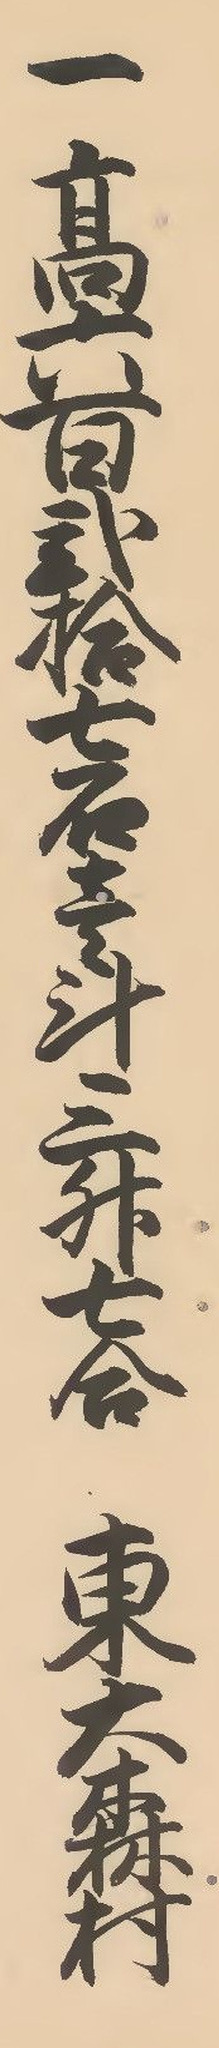一高六百弐拾七石壱斗三升七合東大森村
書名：武蔵国郷帳　上
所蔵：国立公文書館 National Archives of Japan
